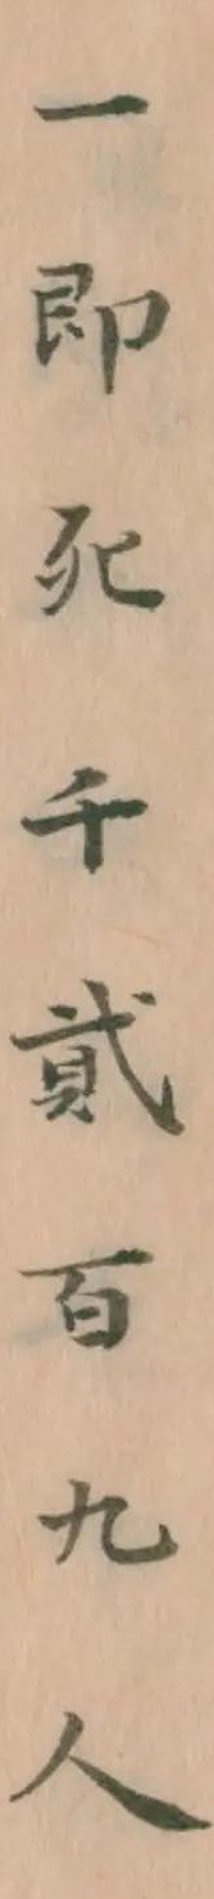一即死千貮百九人
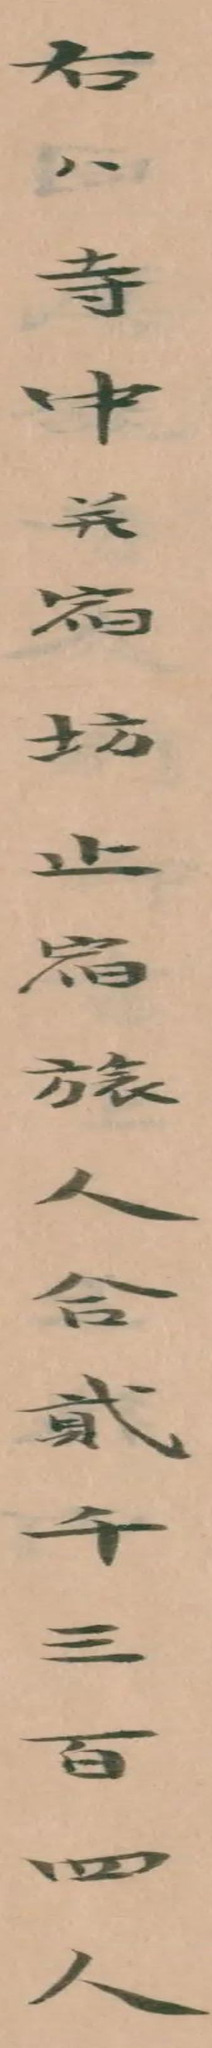右ハ寺中并宿坊止宿旅人合貮千三百四人
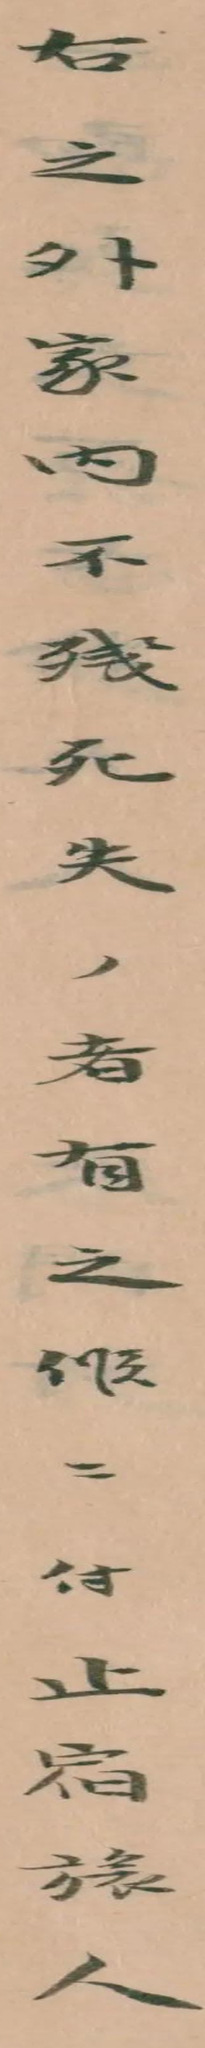右之外家内不残死失ノ者有之候ニ付止宿旅人
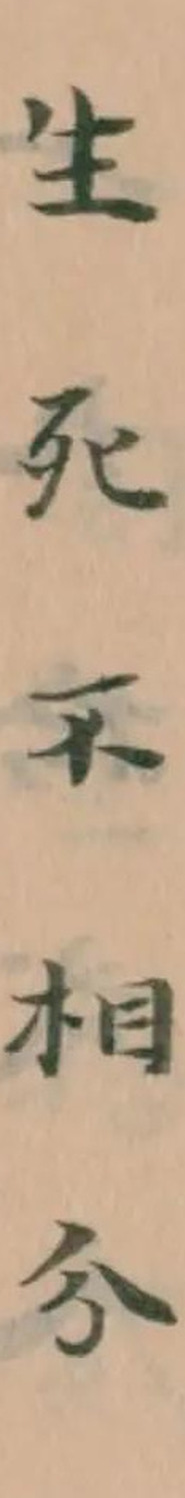生死不相分
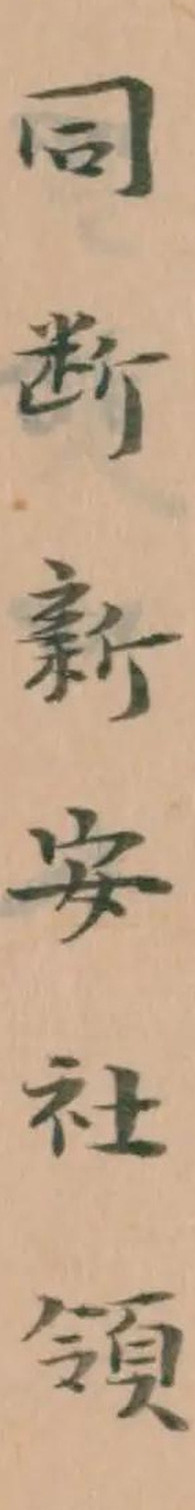同断新安社領
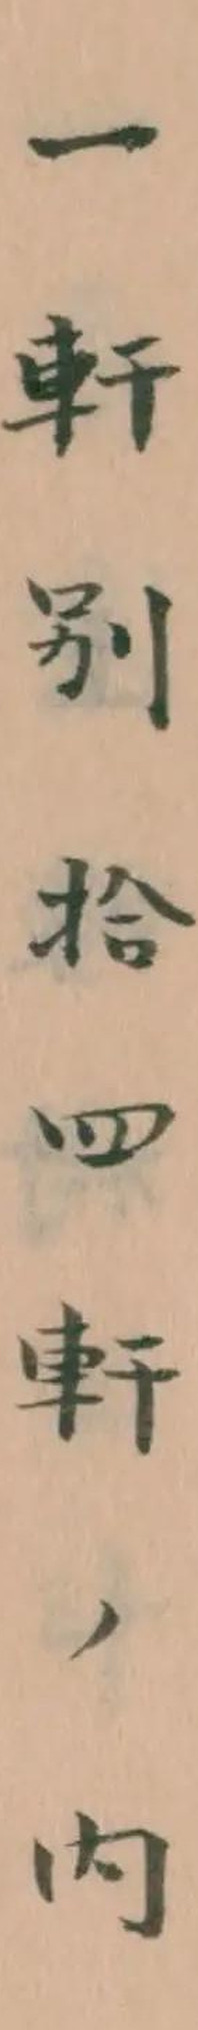一軒別拾四軒ノ内
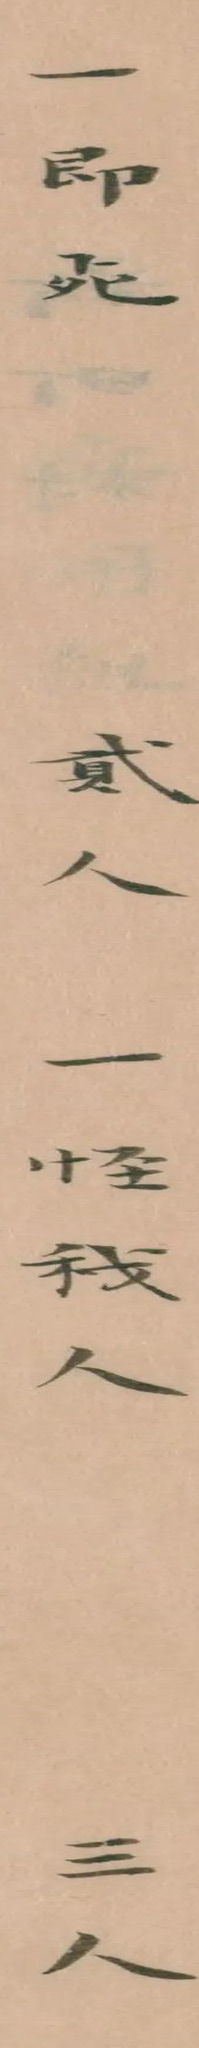一即死貮人一怪我人三人
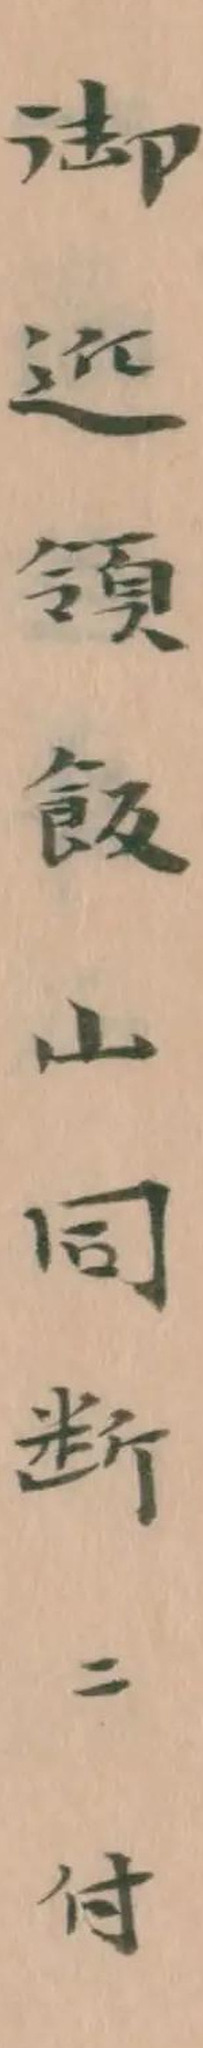御近領飯山同断ニ付
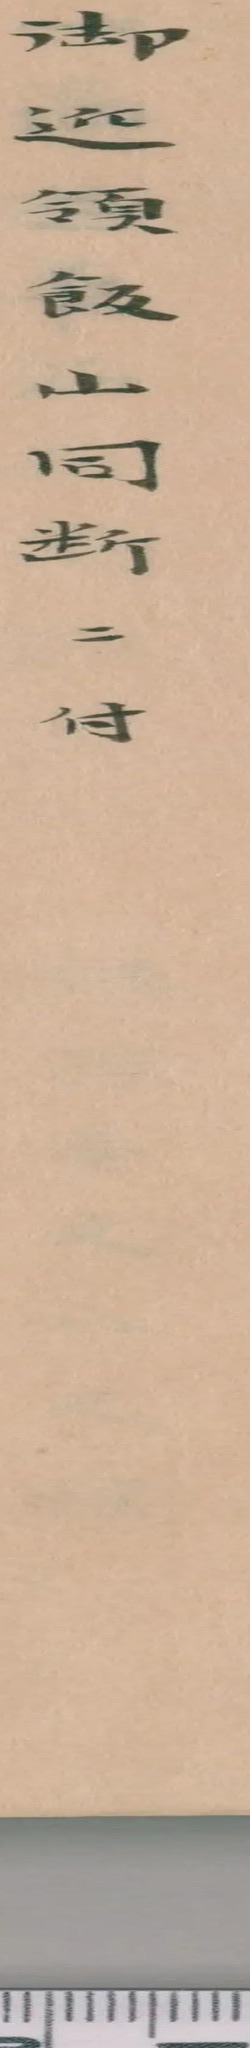御近領飯山同断ニ付
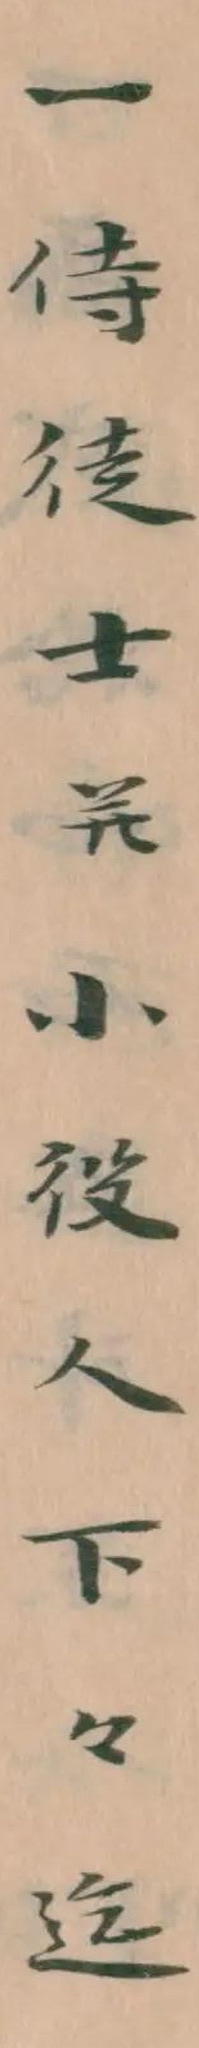一侍徒士并小役人下々迄
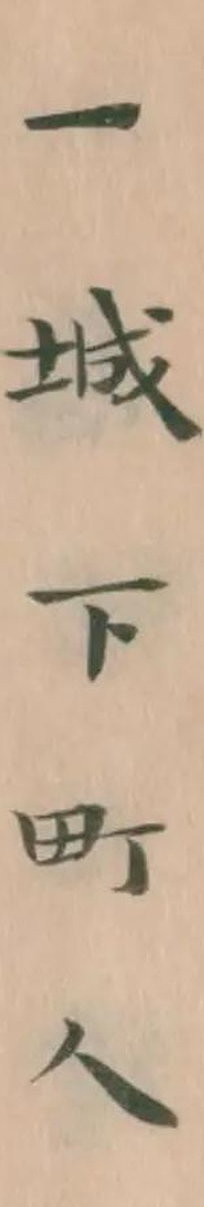一城下町人
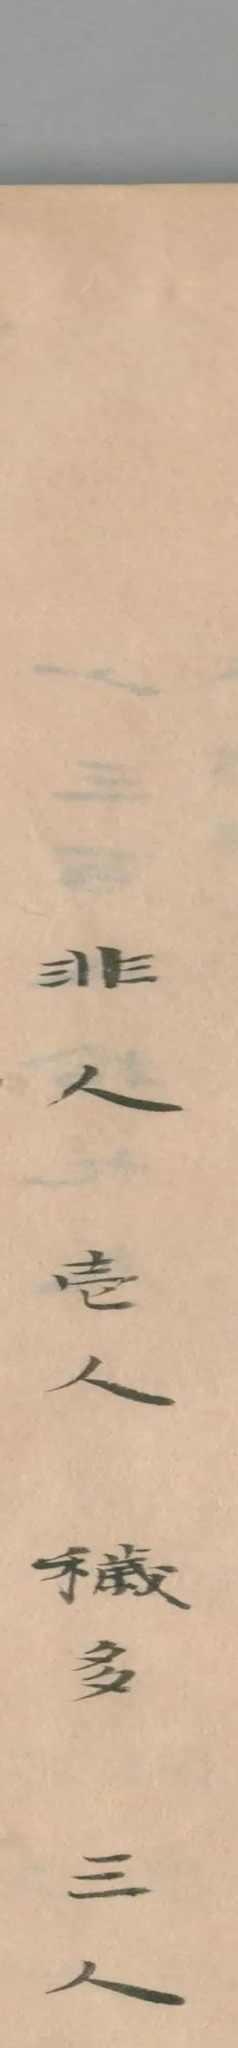非人壱人穢多三人
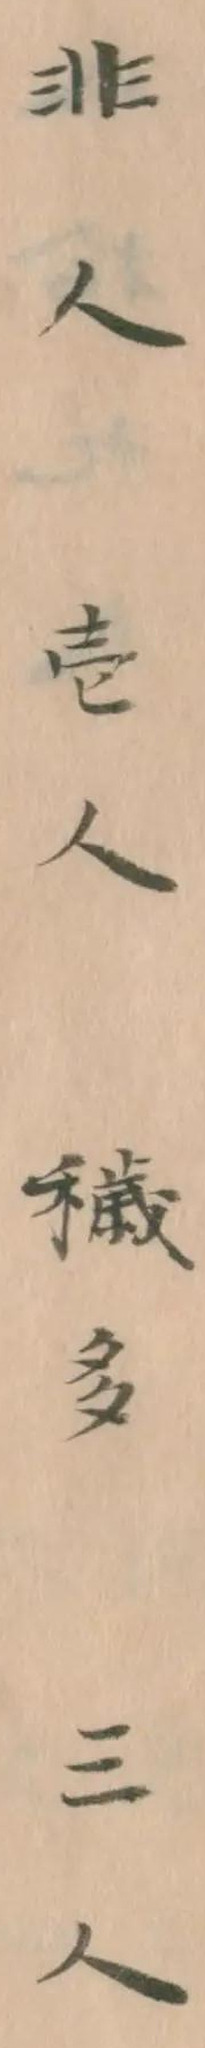非人壱人穢多三人

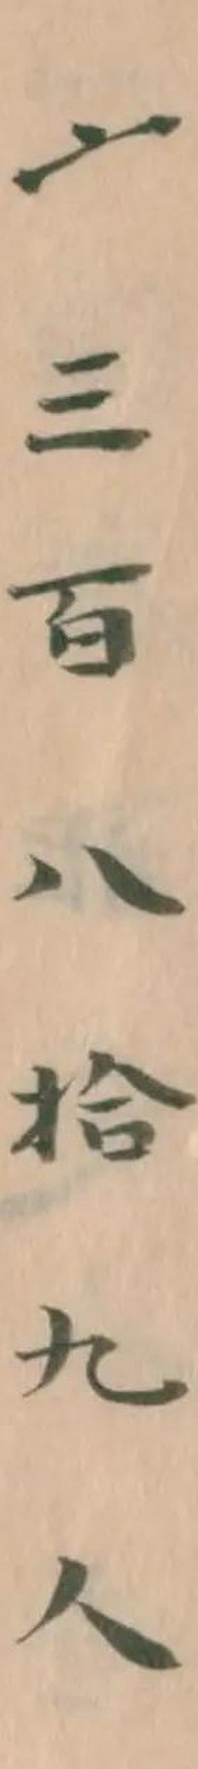〆三百八拾九人
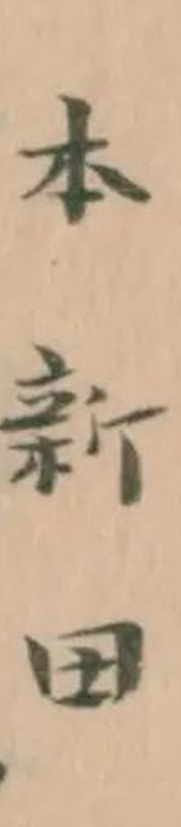本新田
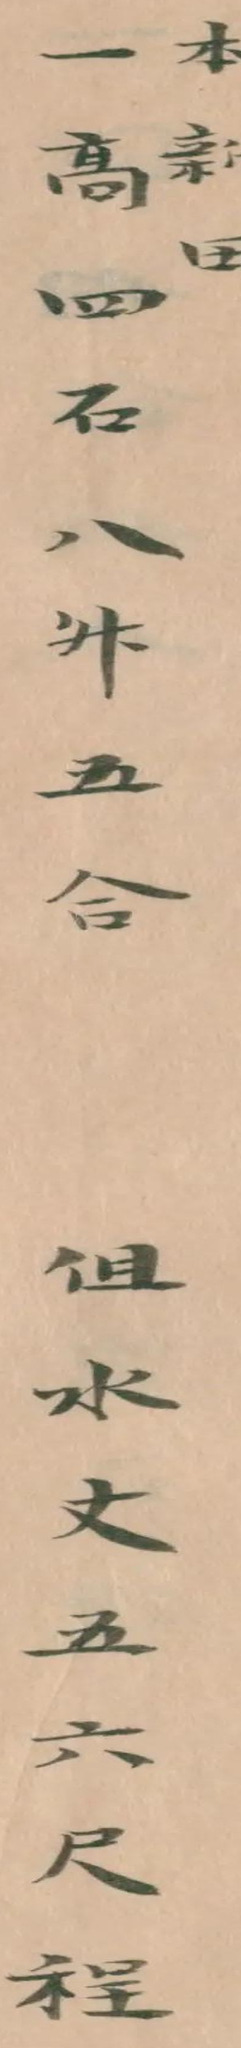一高四石八升五合但水丈五六尺程
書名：地災撮要. 巻5-6(地震之部)
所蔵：国立国会図書館 National Diet Library, JAPAN
